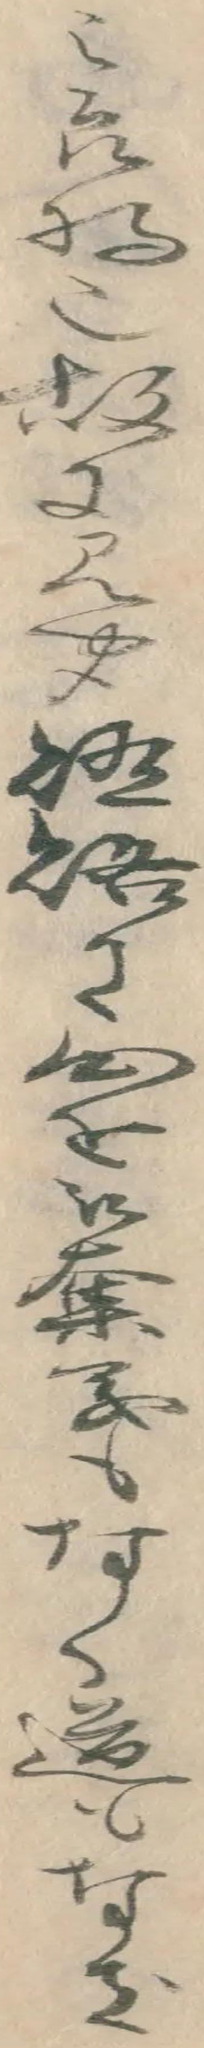之良将也故に見聞賄賂に心を被奪義もなく道もなき

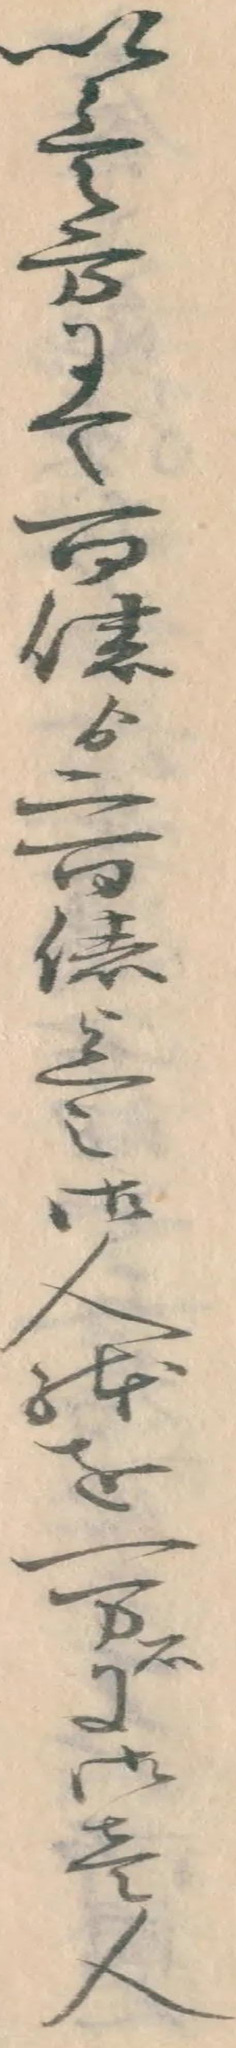以上之方にて百俵ゟ二百俵迄之御人体を一万石に御壱人
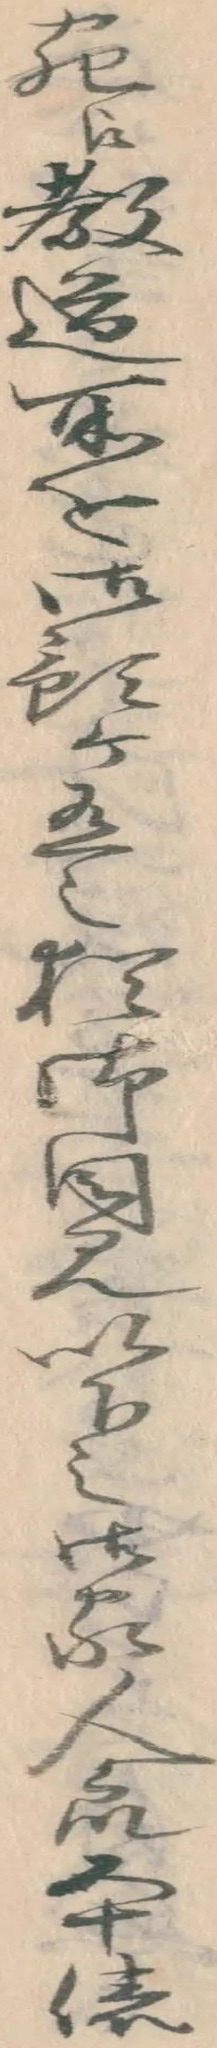宛え教道所を御預け有之猶御目見以下之御家人衆五十俵
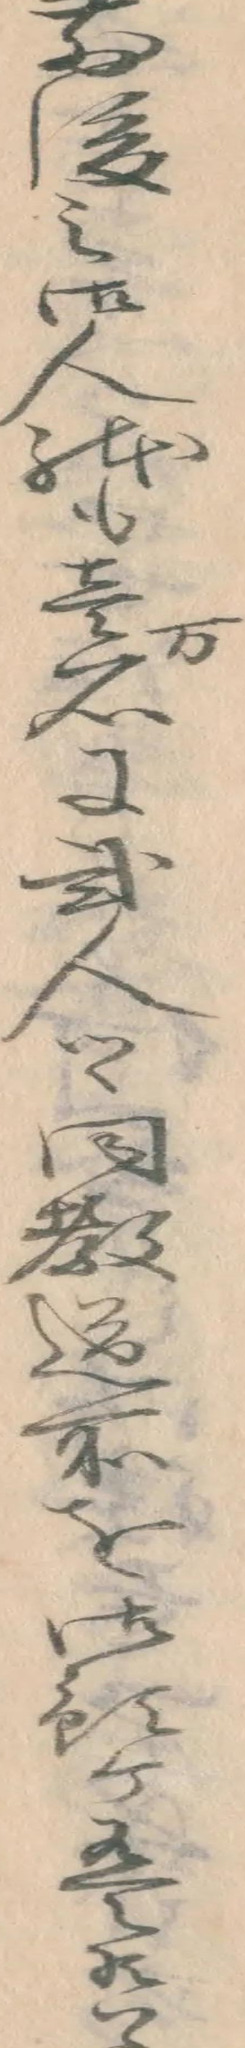前後之御人体も壱万石に弐人つゝ同教道所を御預け有之候はゝ
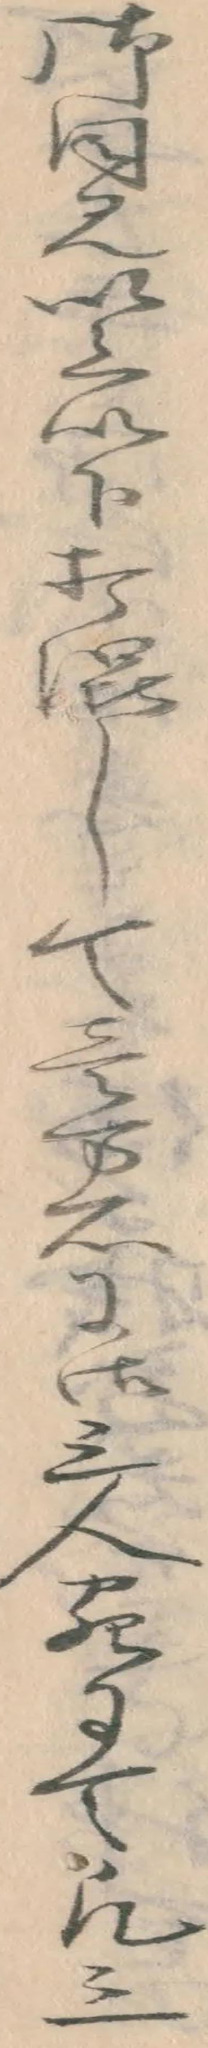御目見以上以下相混して壱万石に御三人宛にて凡三
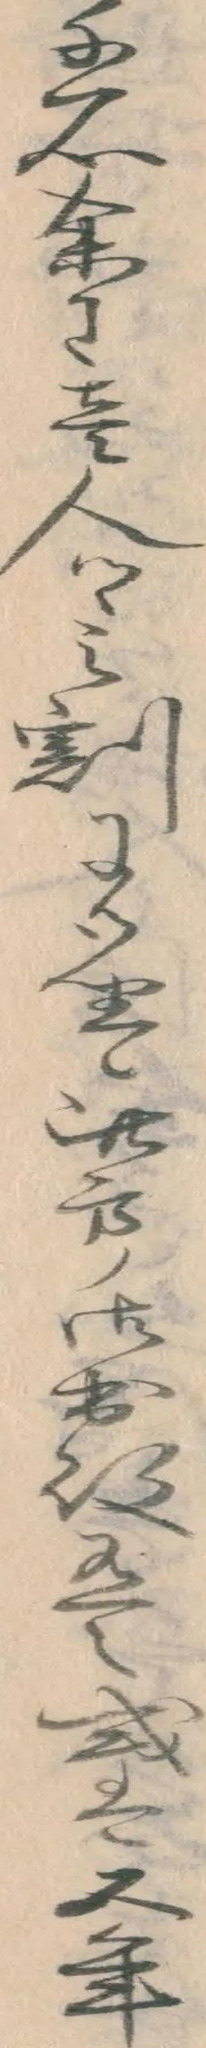千石余に壱人つゝ之割に御坐候此方の御出役有之或は五年
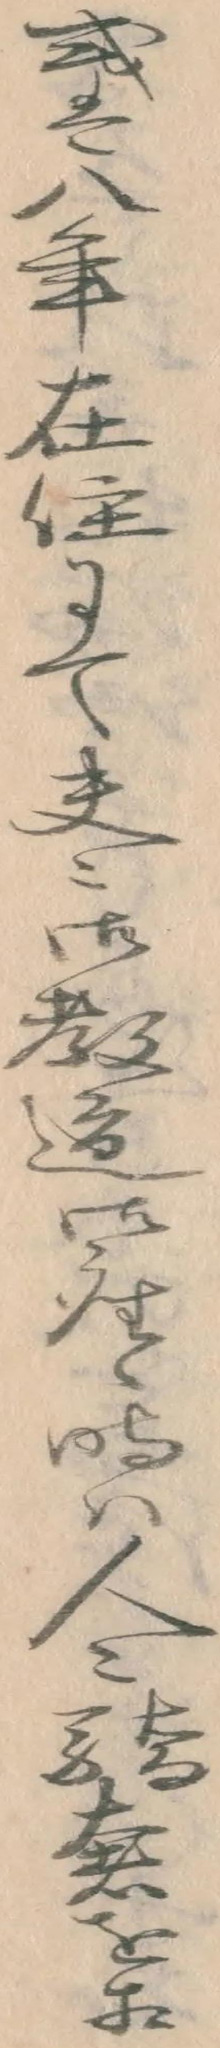或は八年在住にて夫々御教道御座候時は人々驕奢を相
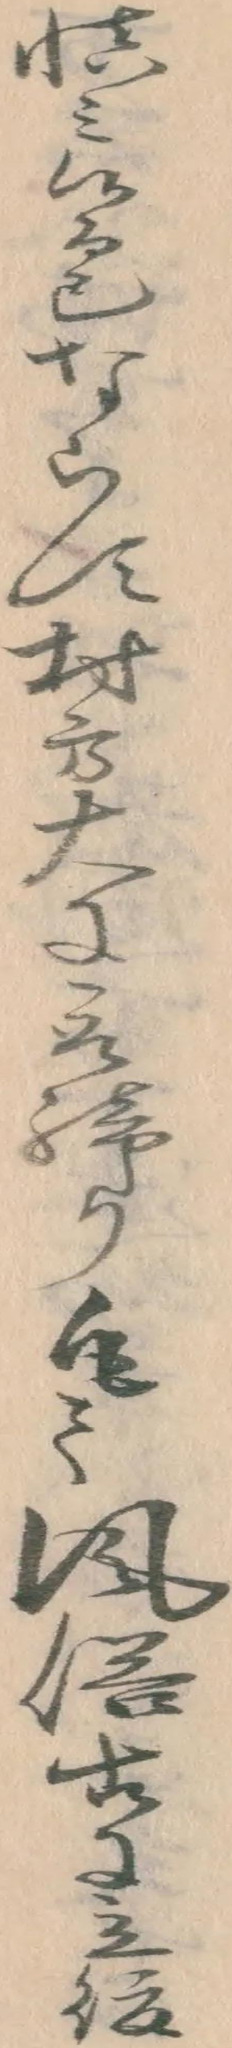慎み候而已ならす村方大に取締り凡て風俗古に立復
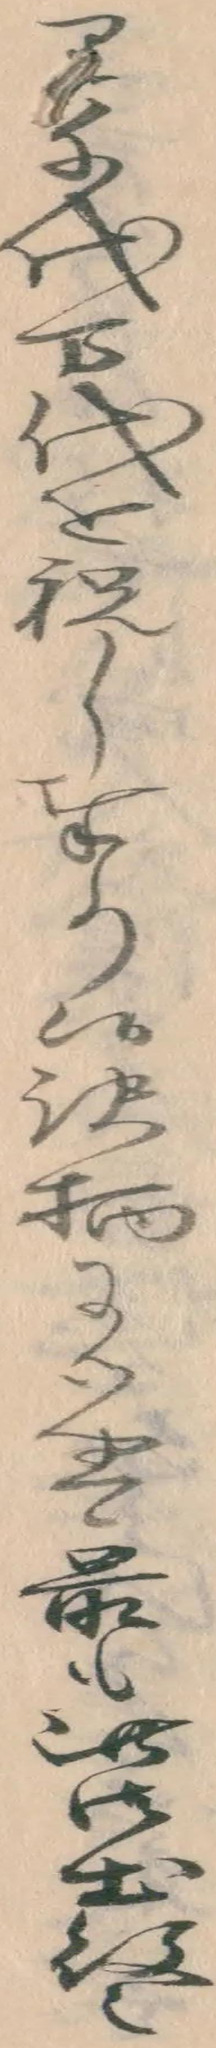り千代万代を祝し奉り候訳柄に御坐候最も此御出役之
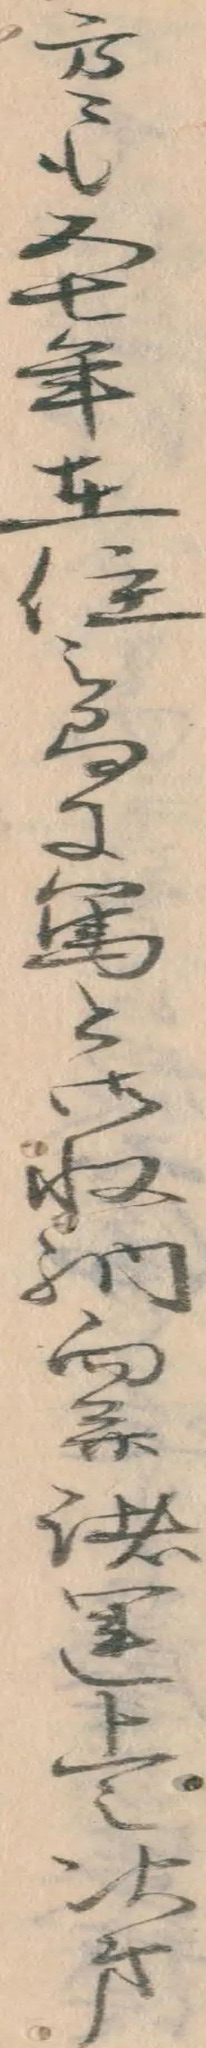方にも五七年在住之間に篤と御収納向并諸運上之次第
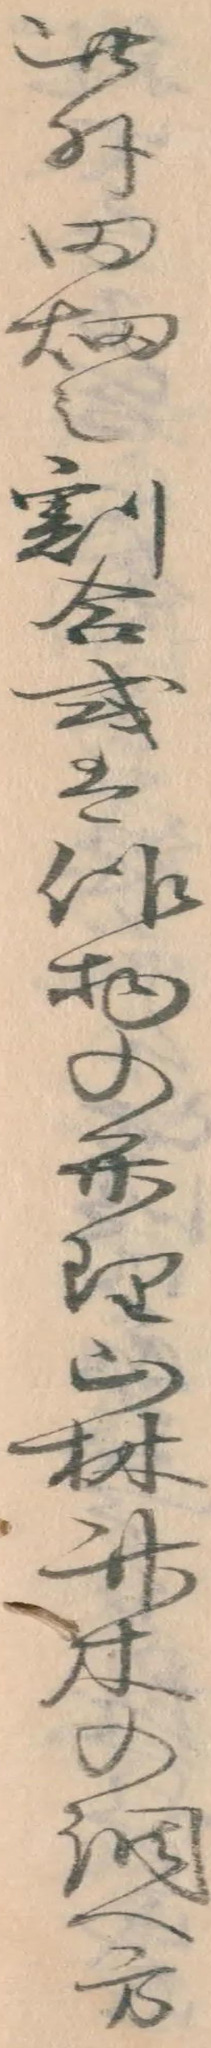此外田畑之割合或は作物の弁理山林竹木の調へ方
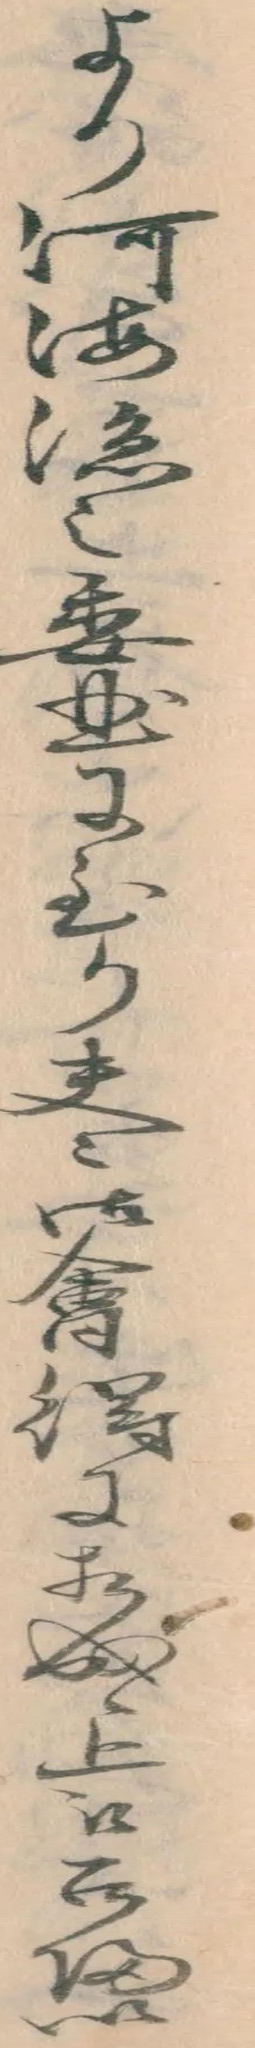より河海漁之委曲に至り夫々御会得に相成候上被召帰以
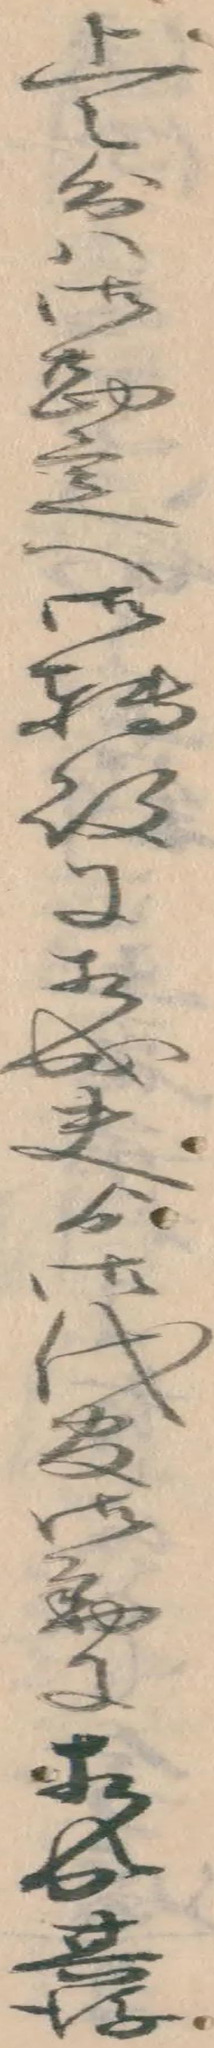上之分は御勘定へ御転役に相成夫ゟ御代官御勤に相成其後
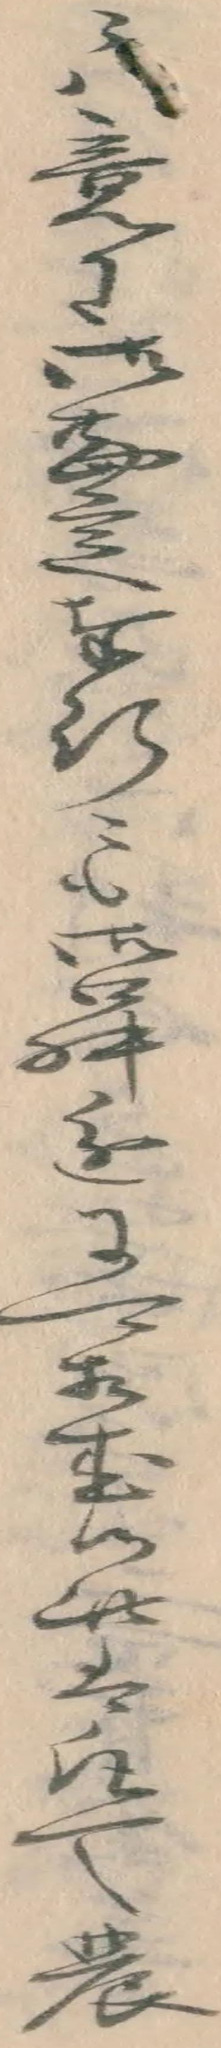には竟に御勘定奉行にも御昇進に可相成候此は凡て農
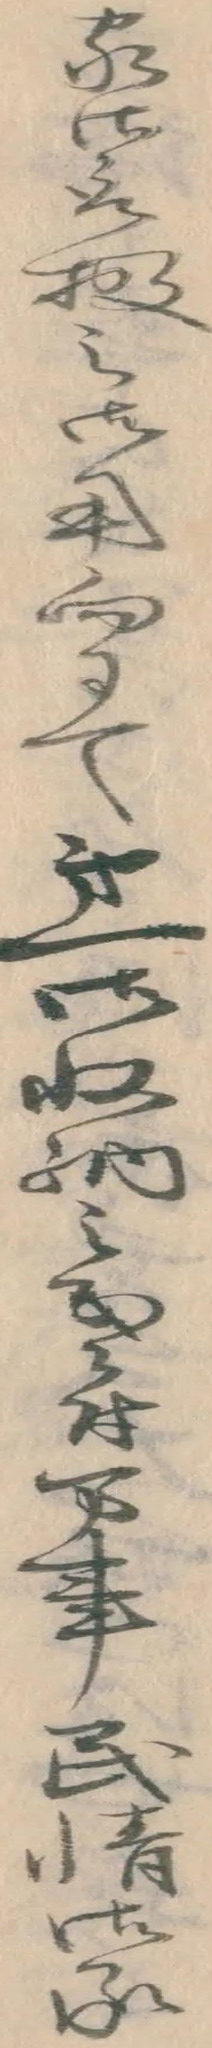家御取扱之御用向にて第一御収納之義に付万事民情御承
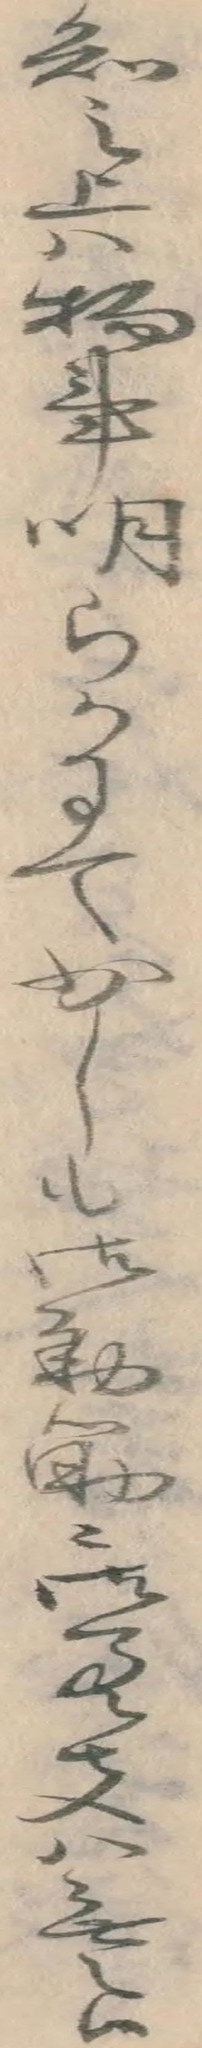知之上は物事明らかにて少しも御勤筋に御差支は無之候
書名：斎庭之穂
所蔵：国立国会図書館 National Diet Library, JAPAN
